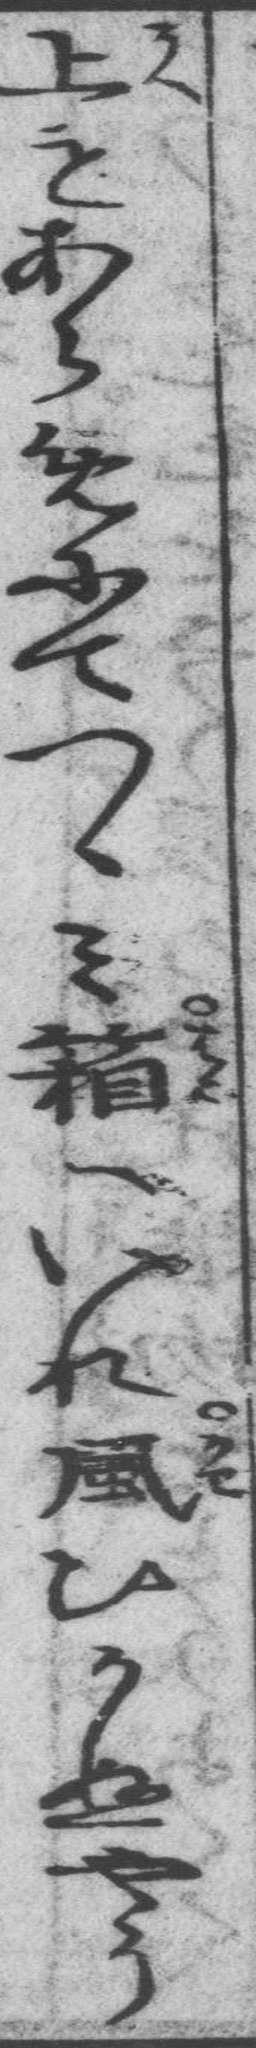上もあらめにてつゝみ。箱へいれ。風ひかぬやう
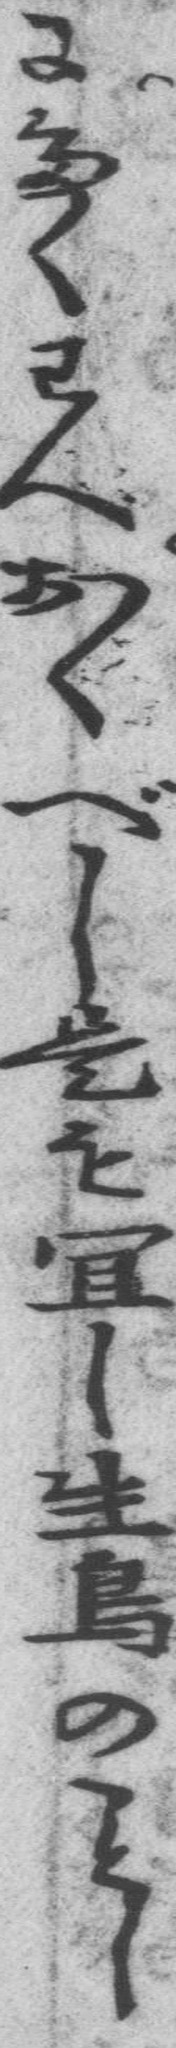に。たくわん。おくべし是も宜し。生鳥のことし
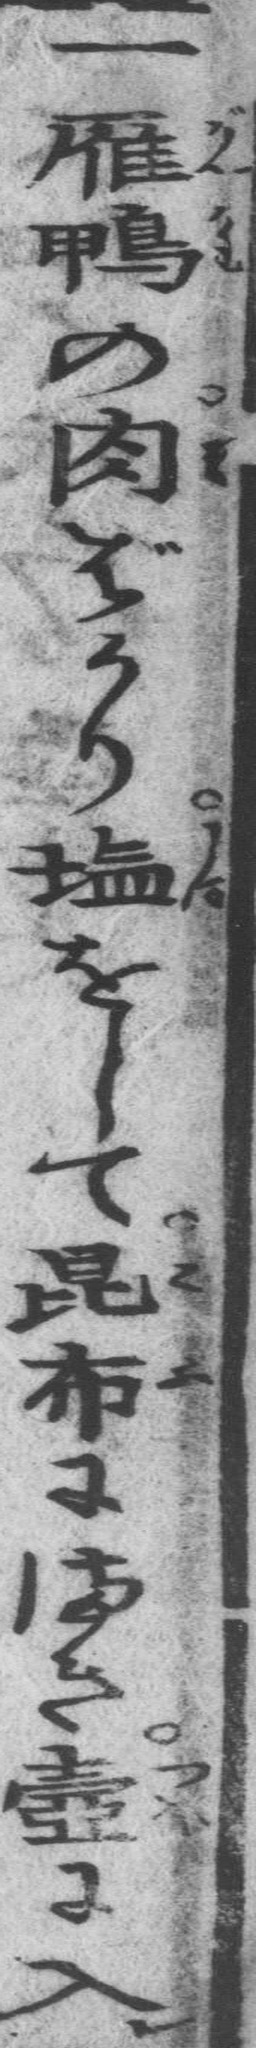一雁鴨の。肉ばかり。塩をして。昆布にまき。壺に入れ
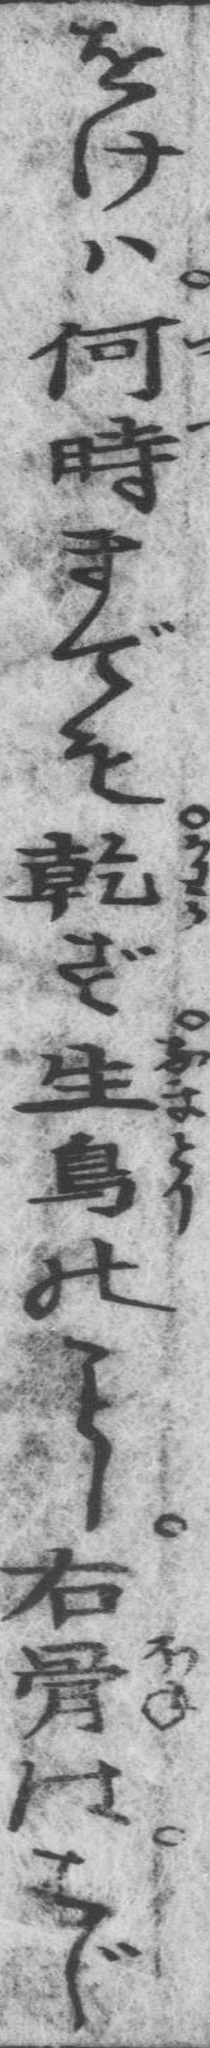をけは。何時までも。乾ず生鳥のことし。右骨ははじ
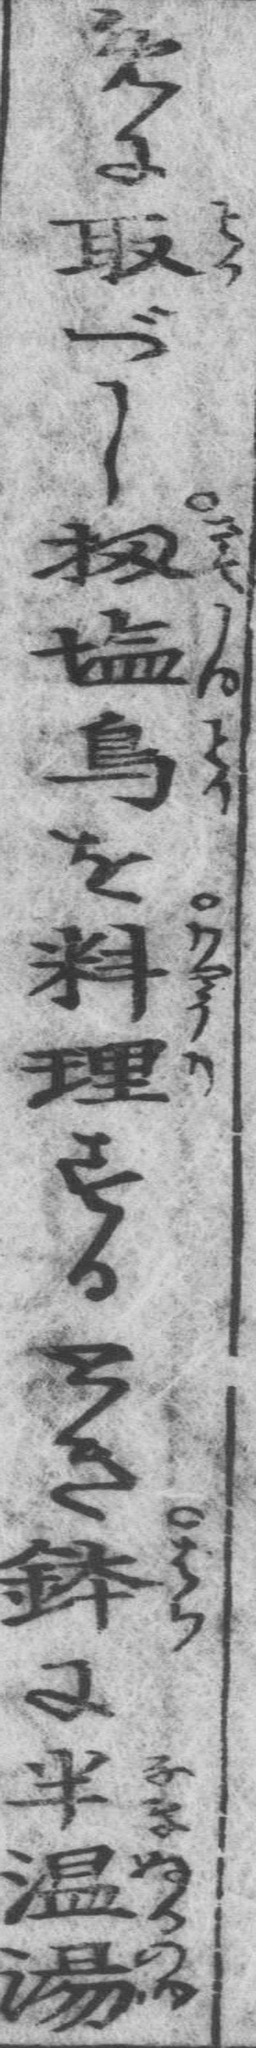めに取べし。扨塩鳥を。料理するとき。鉢に半温湯
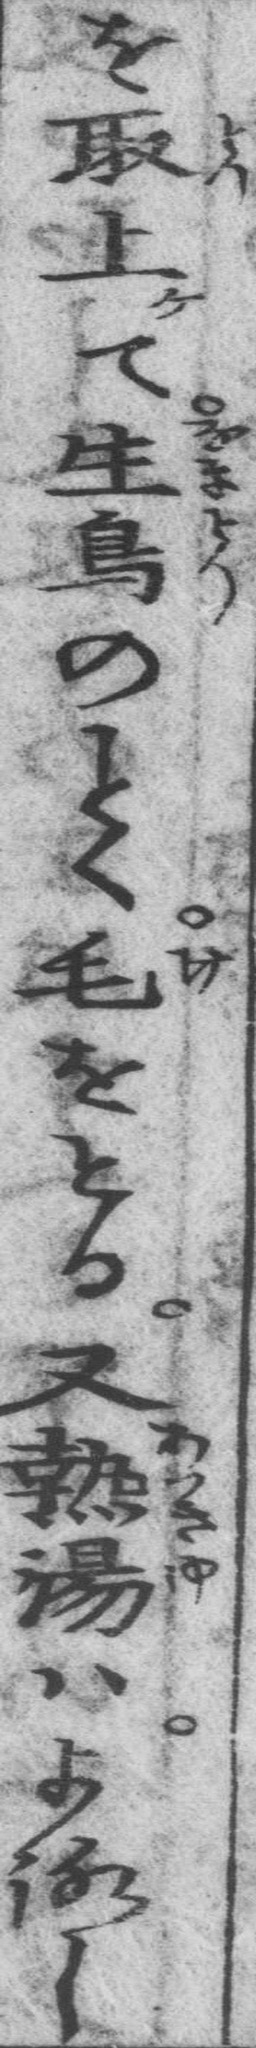を取上けて。生鳥のことく。毛をとる。又熱湯は。よろし
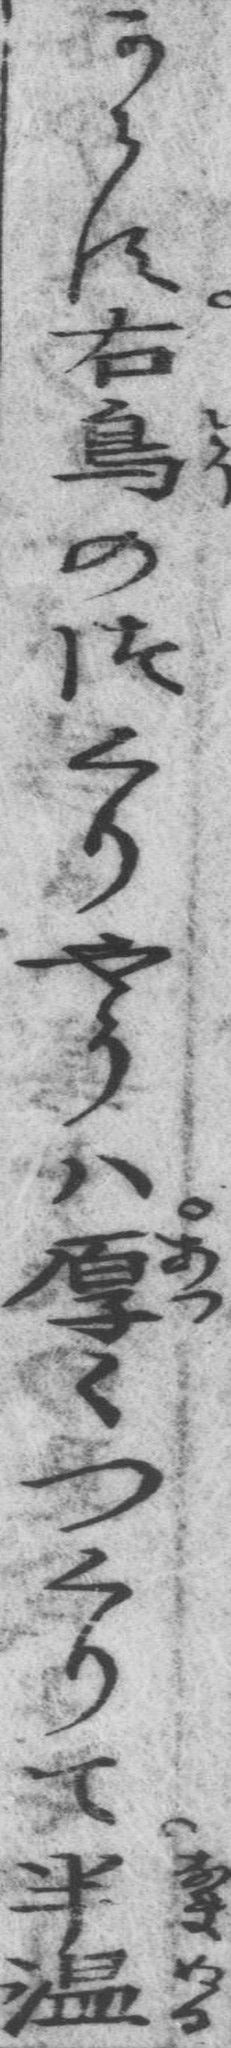からす。右鳥のつくりやうは。厚くつくりて。半温
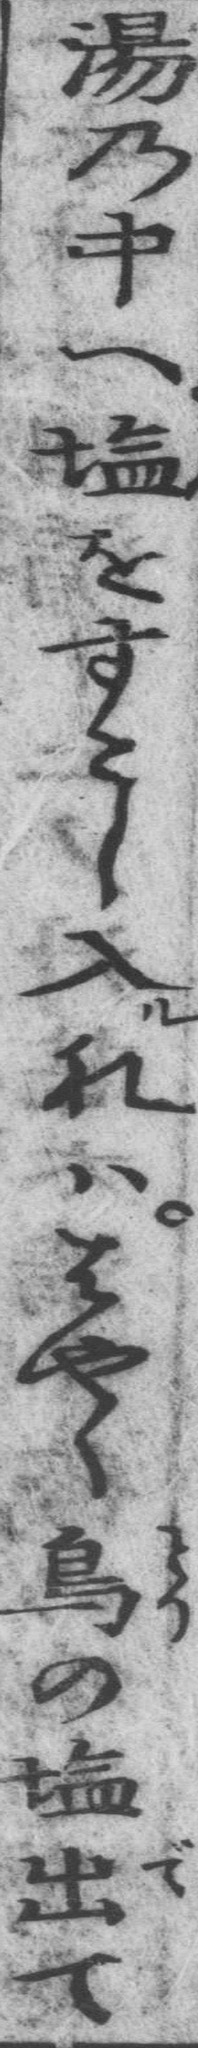湯の中へ。塩をすこし入るれは。はやく鳥の塩出て
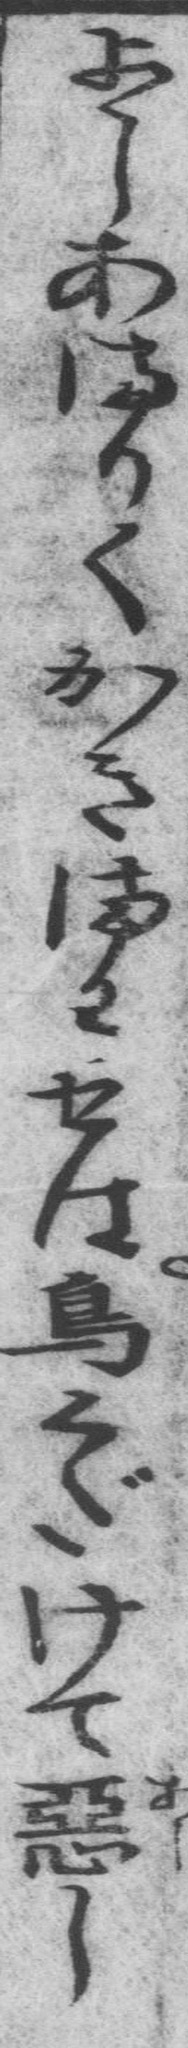よし。あまり〳〵かきまわせは。鳥くだけて悪し
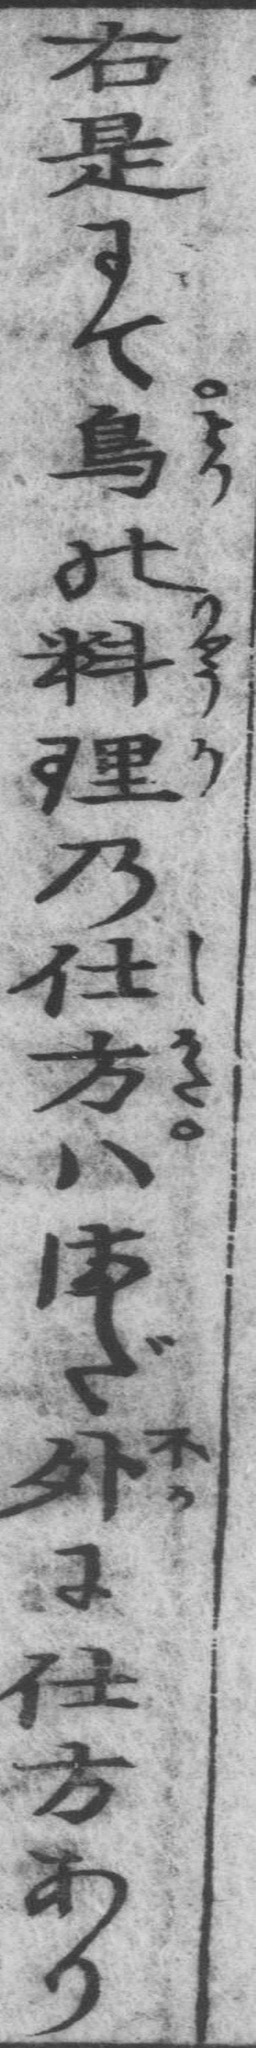右是にて。鳥の料理の仕方。はまだ外に仕方あり

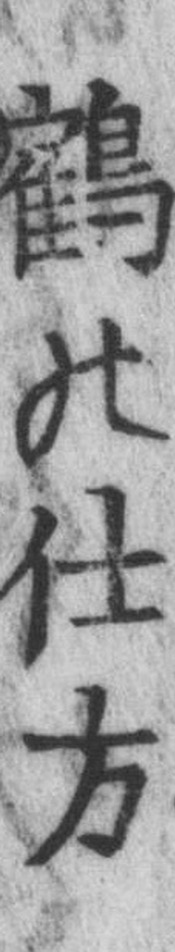鶴の仕方
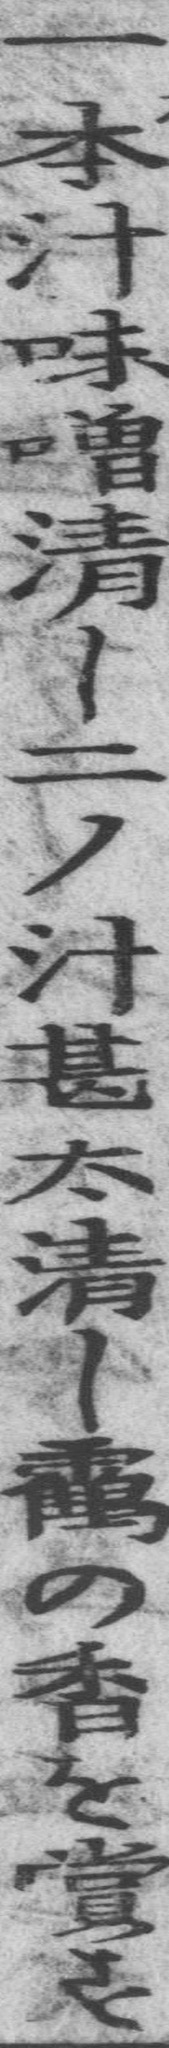一本汁味噌清し。二の汁甚太清し。鶴の香を賞す
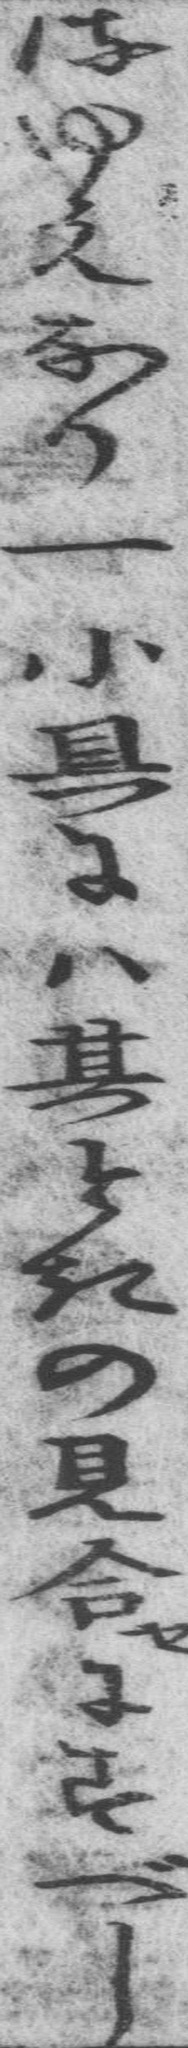るゆえなり一小具には。其ときの。見合せにすべし。
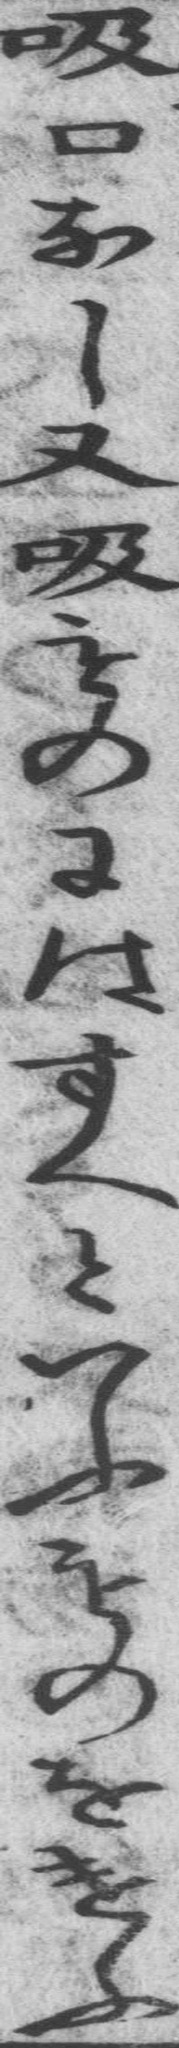吸口なし。又吸ものには。すへと。いふものを遣ふ
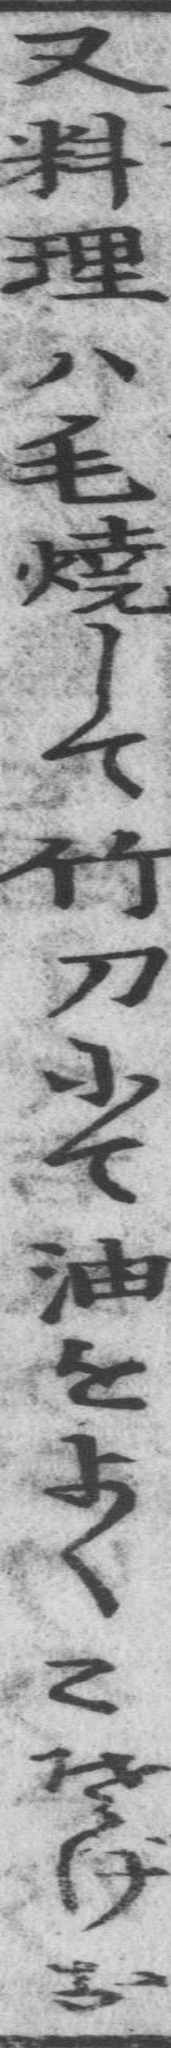又料理は。毛焼して。竹刀にて。油をよく。こそげお
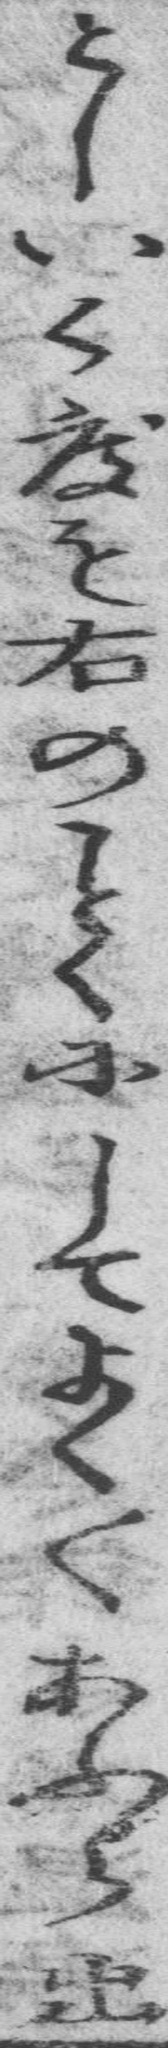とし。いく度も右のことくにして。よく〳〵。あふら出
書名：萬寳料理秘密箱
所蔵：大阪府立大学学術情報センター 国文学研究資料館
